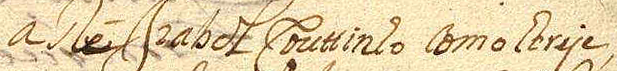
a Ré Jzabel Couttinho como hereje,
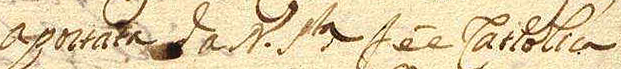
apostata da N. s.ta fée Catholica
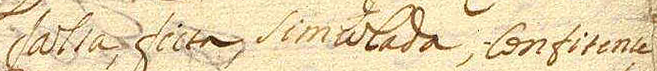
falsa, ficta, simulada, Confitente
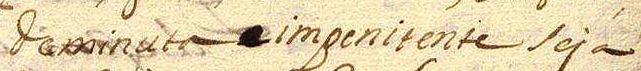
deminuta e impenitente seja
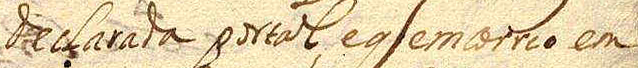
declarada por tal, e q̄ emcorreo em
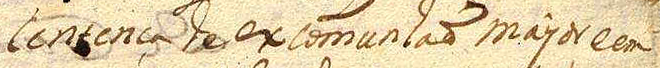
centença de excomunhaõ mayor, com
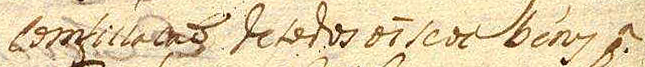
comfiscaçaõ de todos os seos bens p.a
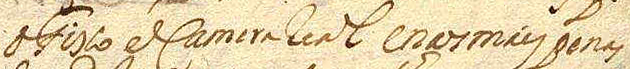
o Fisco, e Camera Real e nas mais penas
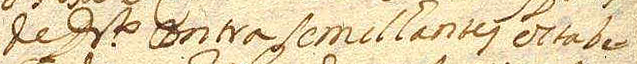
de Dr.to contra semelhantes estabe
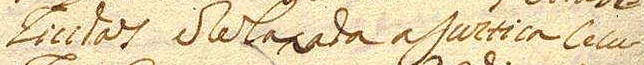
licidas Relaxada a Justiça cecu
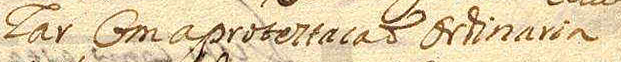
lar Com a protestaçaõ ordinaria
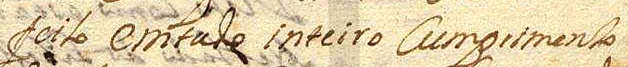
feito em tudo inteiro Cumprimento
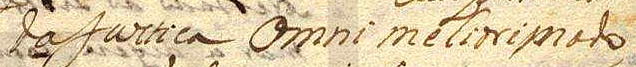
da Justiça Omni meliori modo,
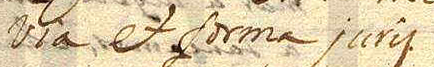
via et forma juris
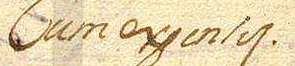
Cum expensis.
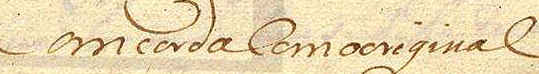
Comcorda Com o original
